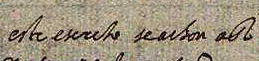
este escrito se achou a R
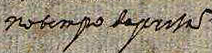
no tempo da prisā
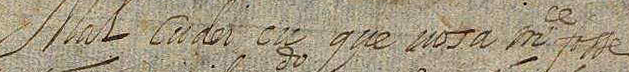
MaL cudei eu que uosa mce fosse
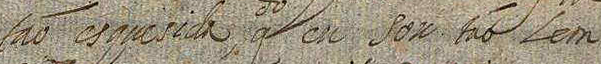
taõ esquesida, e seu sou taõ Lem
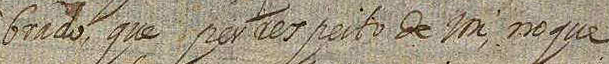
brado, que per respeito de vm, no que
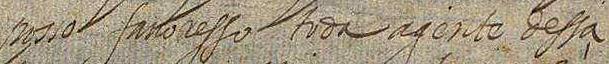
posso fauoresso toda a gente dessa
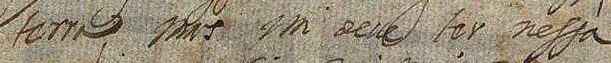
terra, mas vm deue ter nessa
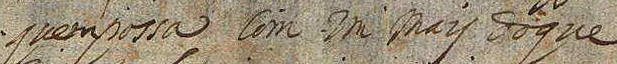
quem possa com vm mais do que
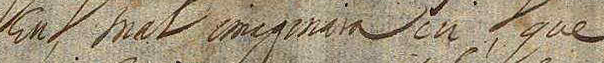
Eu, maL imaginara eu, que
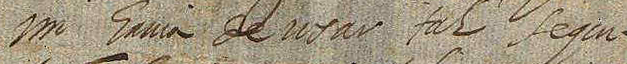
vm hauia de usar tal sequi
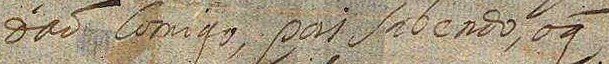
daõ Comigo, pois sabendo, o q̄
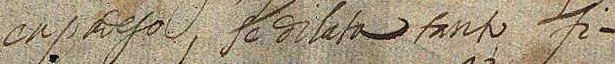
eu padeso, se dilata tanto, fi
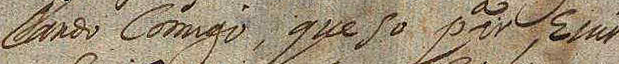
Cando Comigo, que so pa ir, E uir
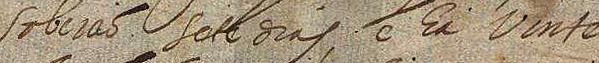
sobeiaõ sete dias, e ha vinte
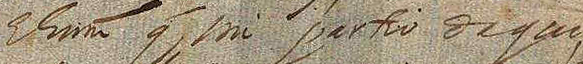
E hum q̄ vm partio daqui
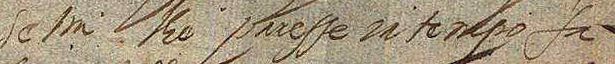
se vm lhe paresse ia tempo fa
